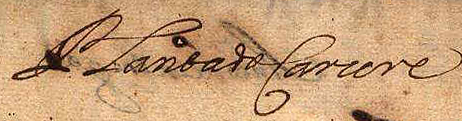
PLanta do Carcere
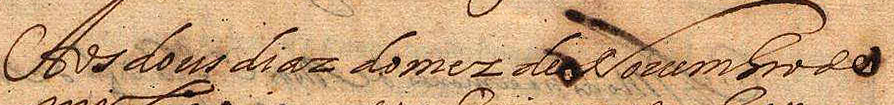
Aos dous diaz do mez de Nouembro de
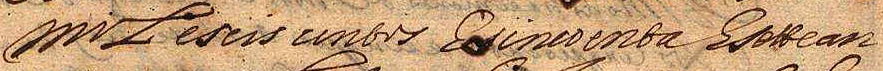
miL e seiscentos E sincoenta E sette an
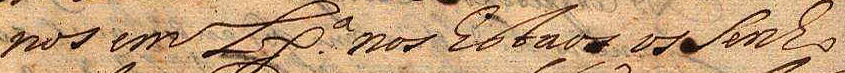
nos em Lx.a nos Estaos, os Senho
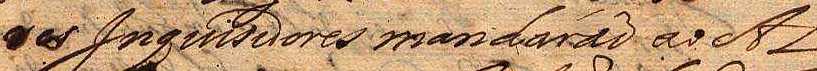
res Jnquisidores mandarão ao AL
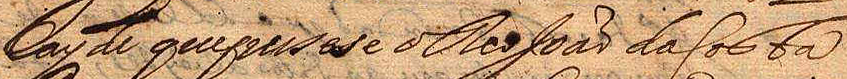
Cayde que pusese o Reo Joaõ da Costa
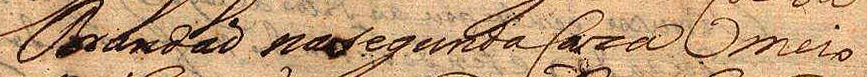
Brandaõ na segunda Caza meio
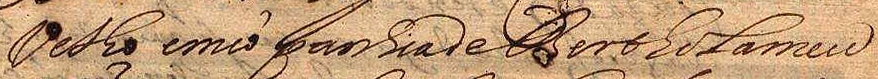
Velho em cōpanhia de Bertholameu
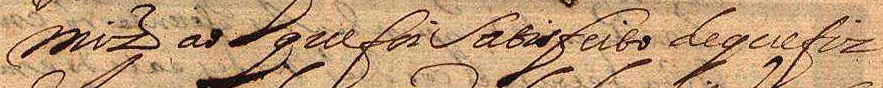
miz̄ ao que foi satisfeito de que fiz
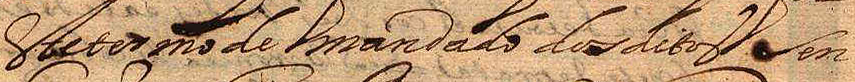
este termo de mandado dos ditos Sen
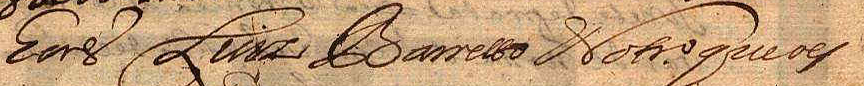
hores Luiz Barretto Notr.o que o es
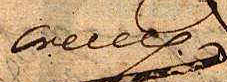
creuy
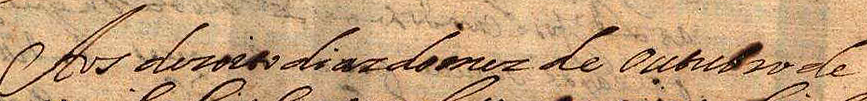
Aos dezoito diaz do mez de Outubro de
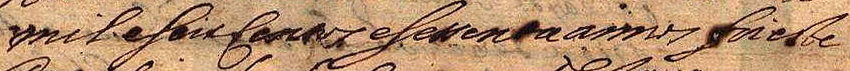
mil e seisCentos e sessenta annos foi este
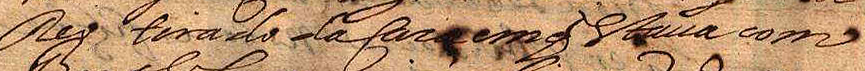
Reo tirado da Caza em q̄ estaua com
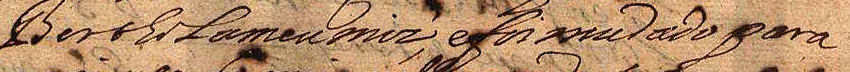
Bertholameu miz̄, e foi mudado para
